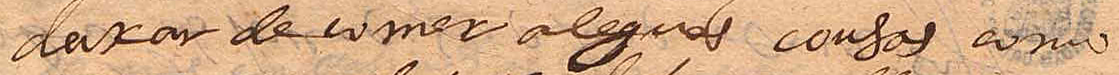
deixar de comer allguas̄ cousas como
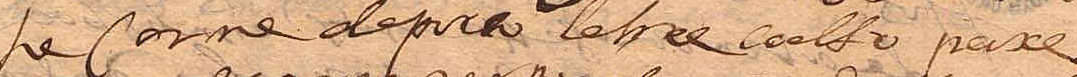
he Carne de porco lebree coelho peixe
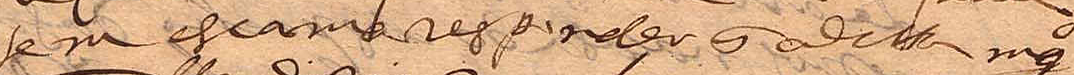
sem escama respondeo q̄ a ditta mgda
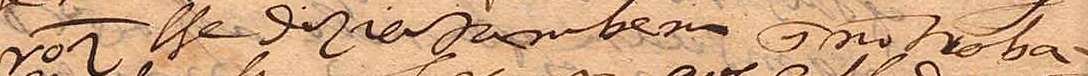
rōz lhe dizia tambem q̄ nō traba
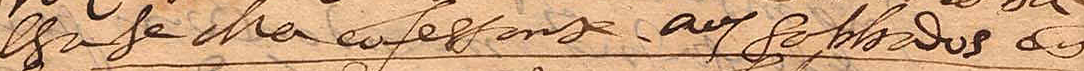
lhase ella cōfessante aos sabbados e q̄
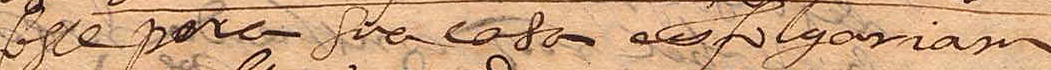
fosse pera sua casa e q̄ folgariam
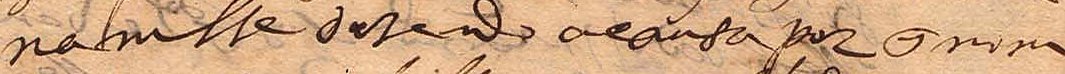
nam lhe dizendo a causa por q̄ nom
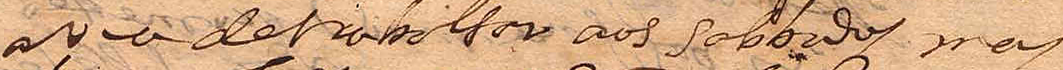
avia de trabalhar aos sabbados mas
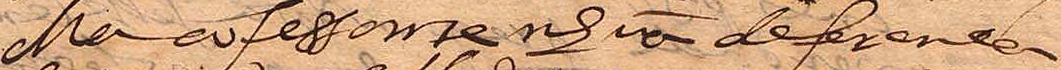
ella cōfessante nhūa deferenca
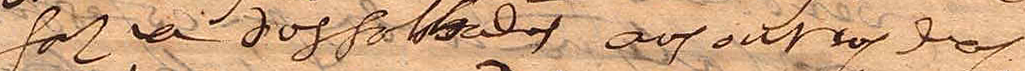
fazia dos sabbados aos outros dias
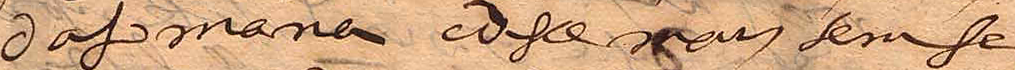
da somana e disse mais sem ser
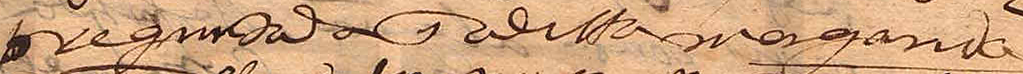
preguntada q̄ a ditta margarida
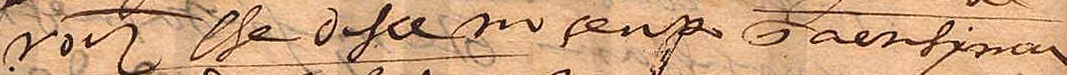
roīz lhe disse no tenpo q̄ a ensynou
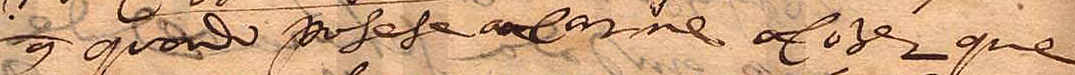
q̄ quando posese a carne a Cozer que
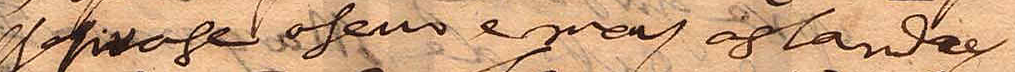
lhe tirase o seuo e mais as landres
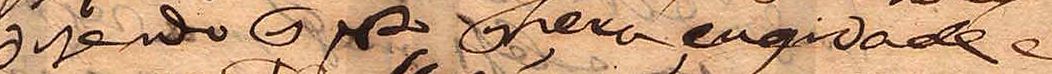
dizendo q̄ isto q̄ hera çugidade e
